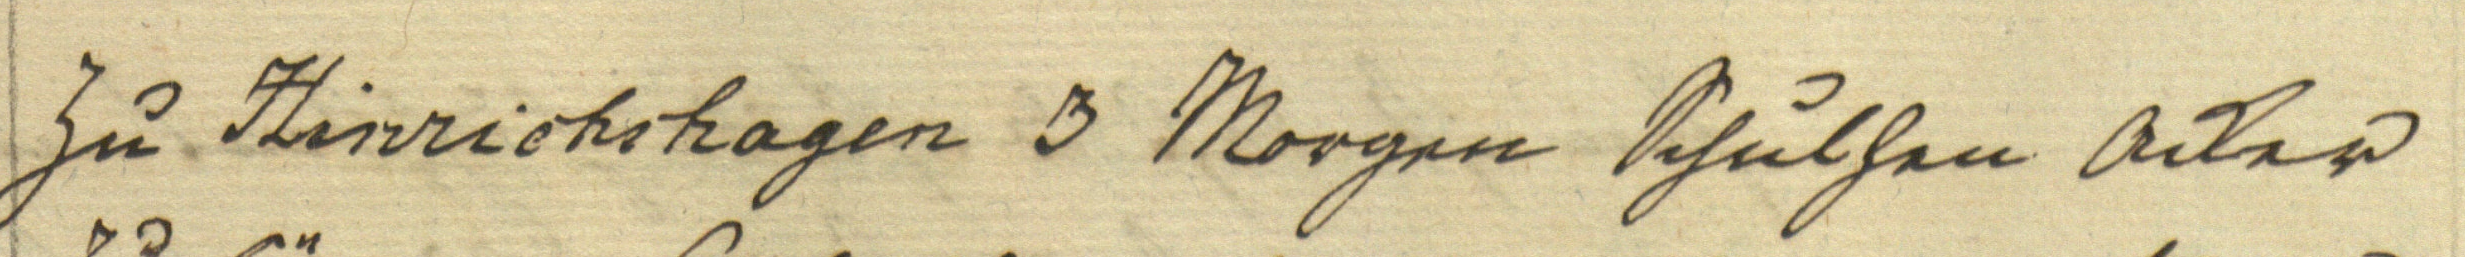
zu Hinrichshagen 3 Morgen Schulzen Acker
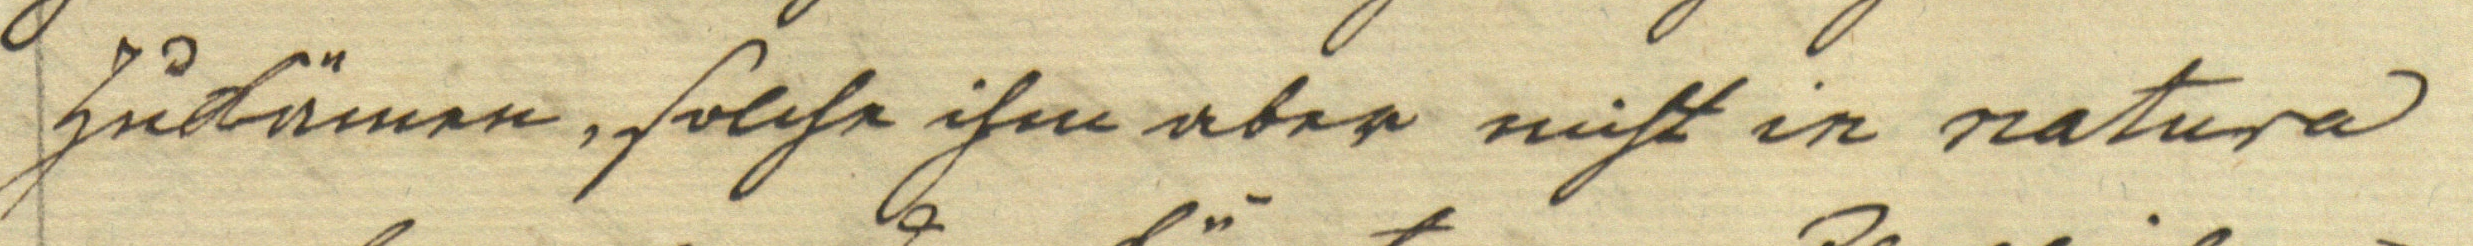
zukämen, solche ihm aber nicht in natura
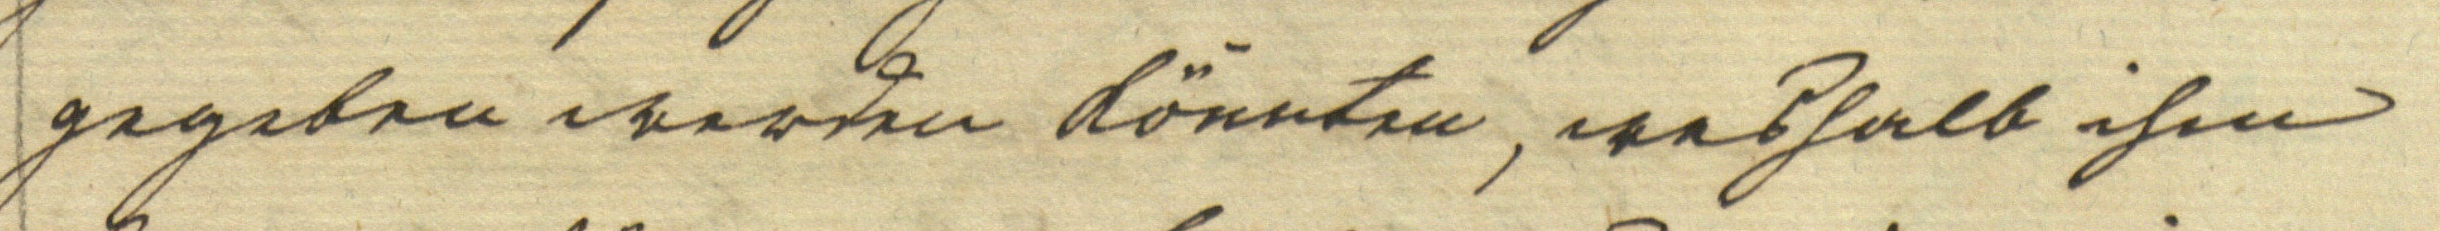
gegeben werden könnten, weshalb ihm
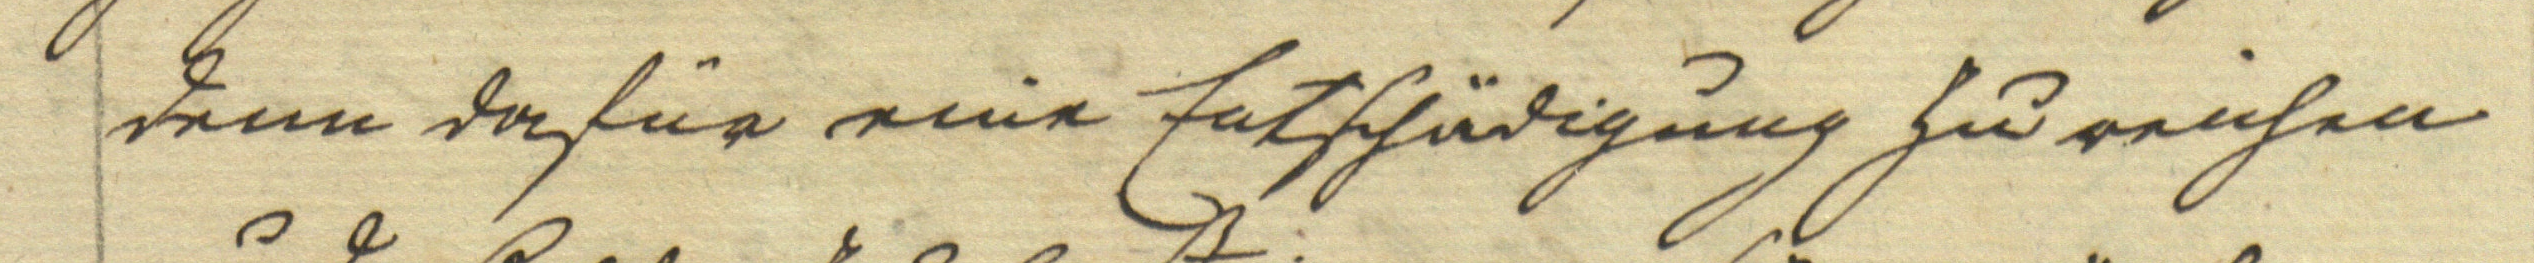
denn dafür eine Entschädigung zu reichen
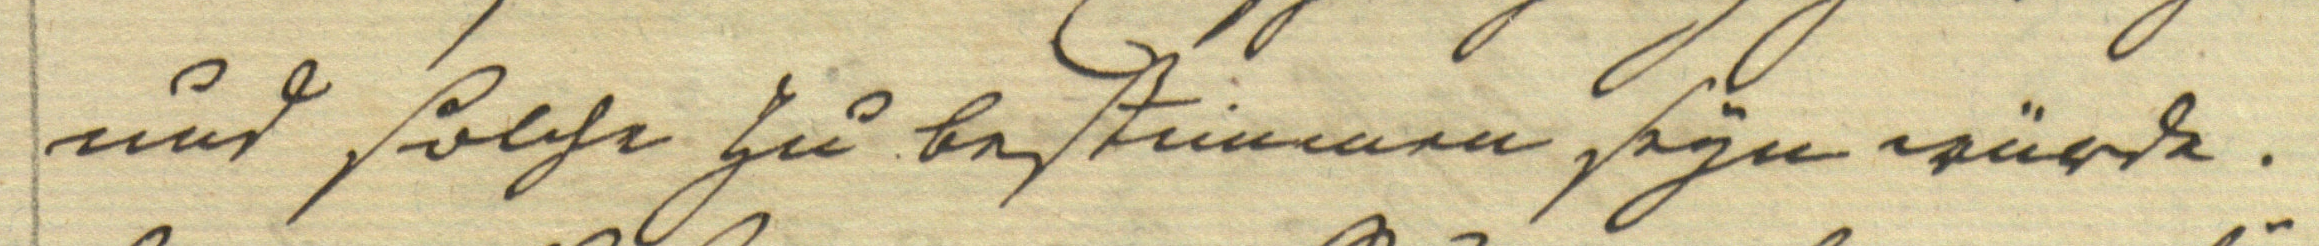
und solche zu bestimmen seÿn würde.
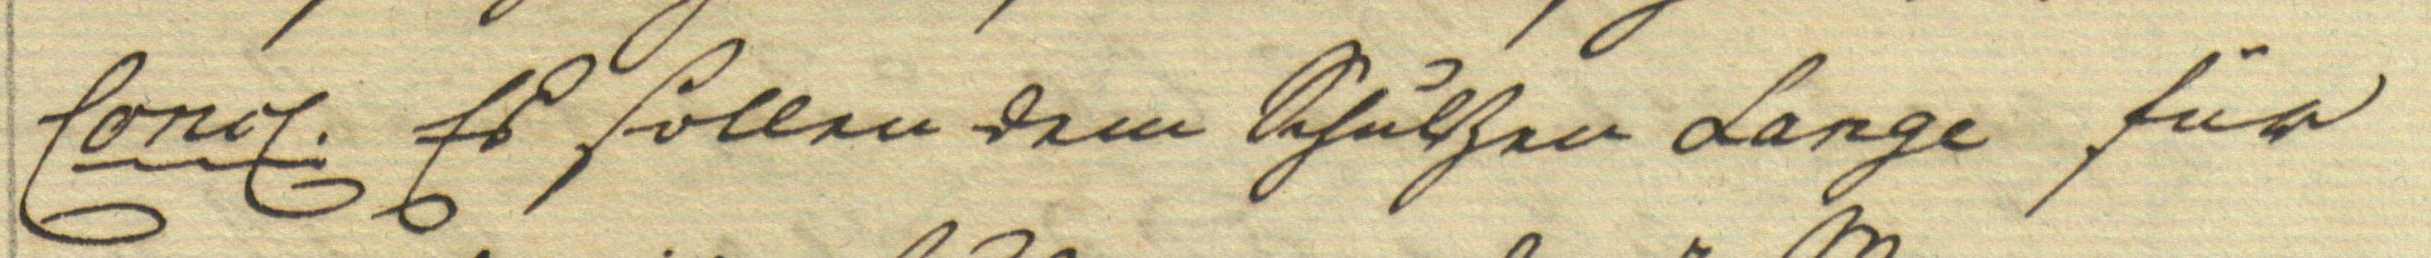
Concl. Es sollen dem Schulzen Lange für
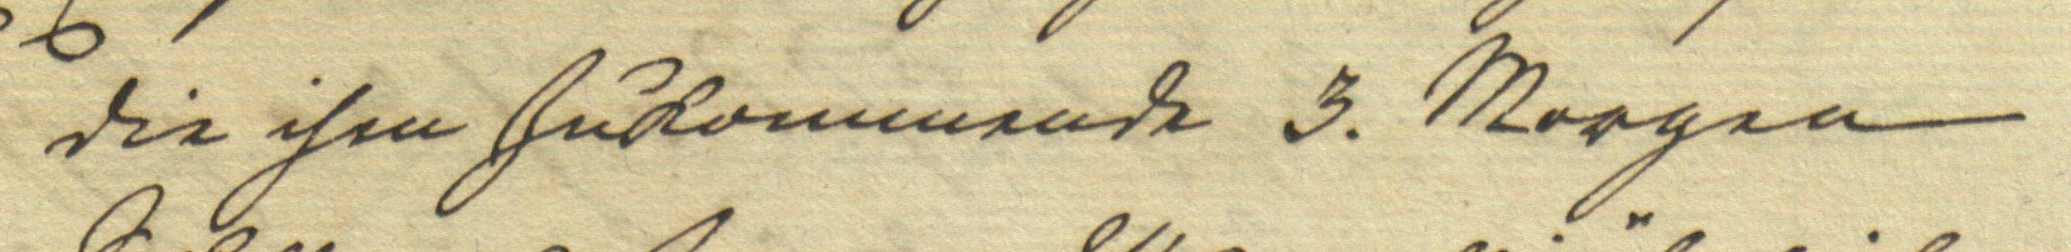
die ihm zukommende 3. Morgen
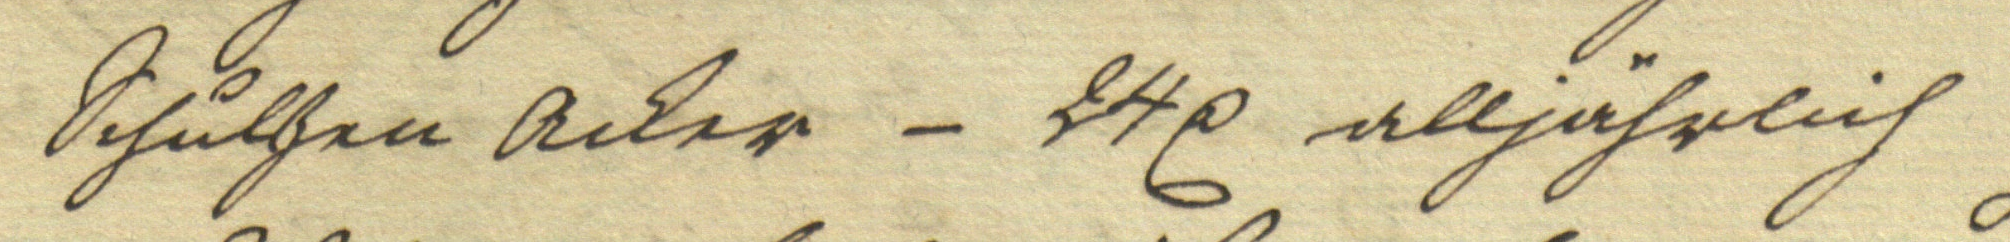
Schulzen Acker 24 l alljährlich
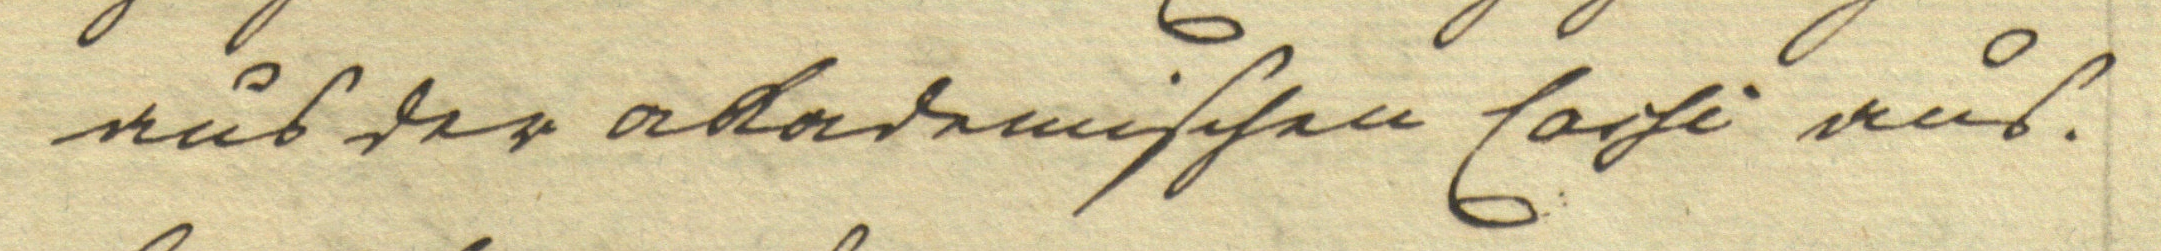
aus der akademischen Casse aus¬
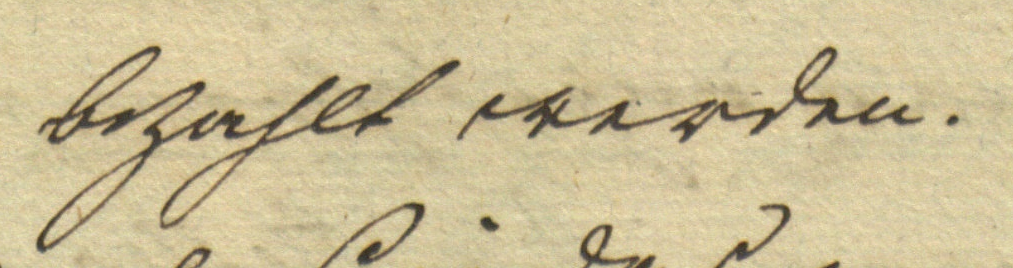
bezahlt werden.
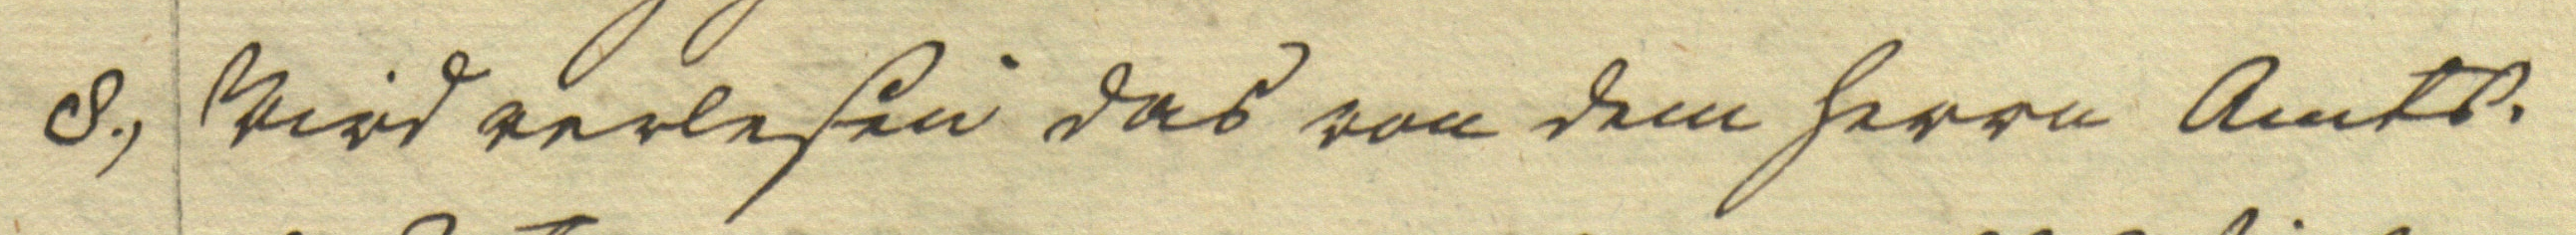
8., Wird verlesen das von dem Herrn Amts¬
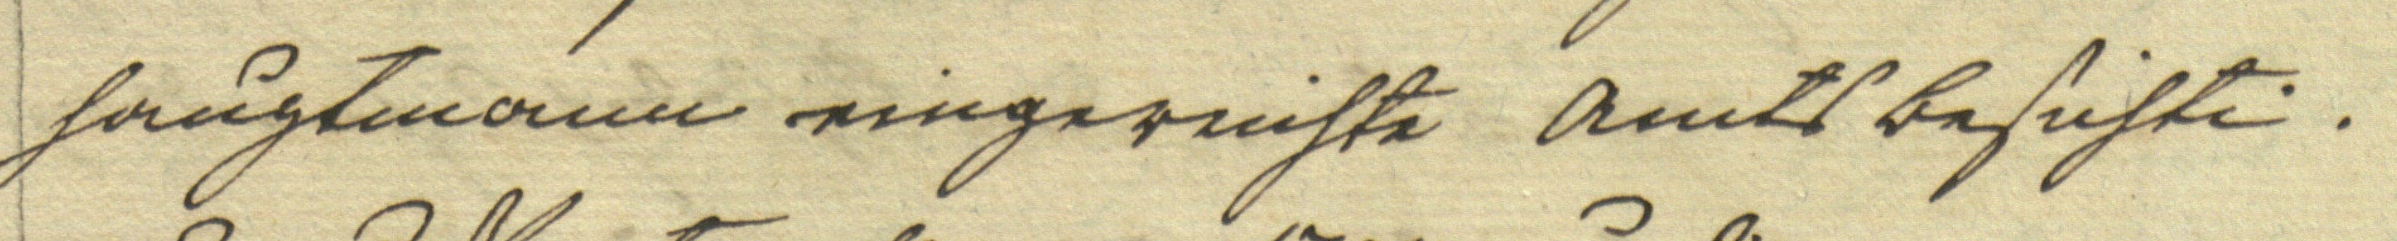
hauptmann eingereichte Amtsbesichti¬
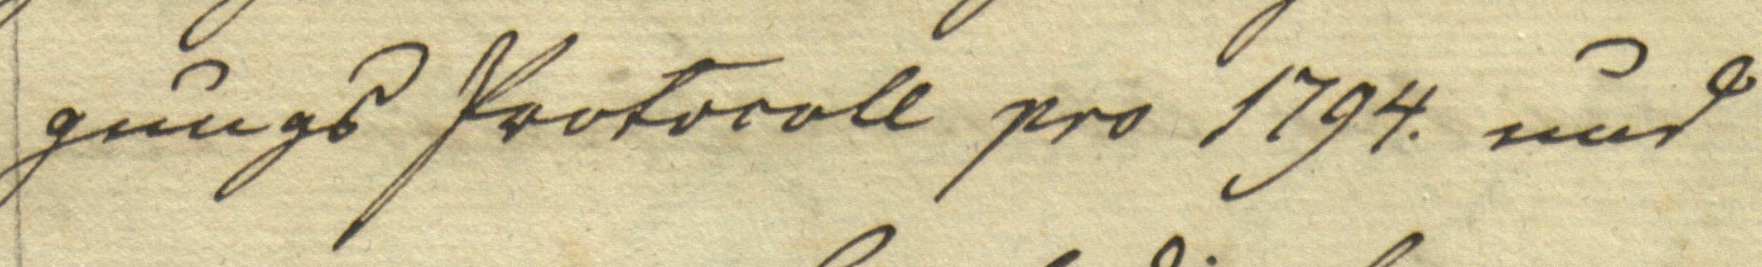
gungs Protocoll pro 1794. und
